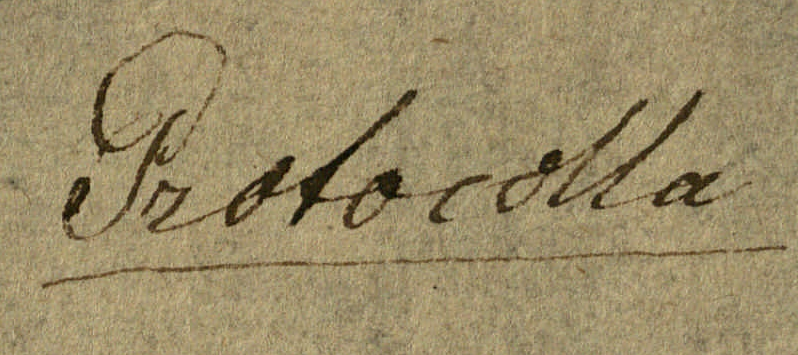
Protocolla
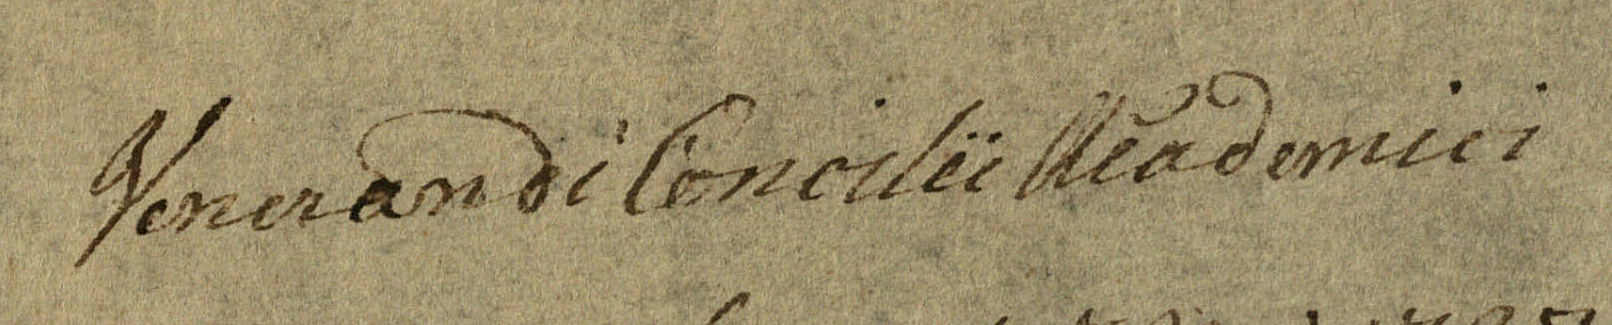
Venerandi Concilii Academici
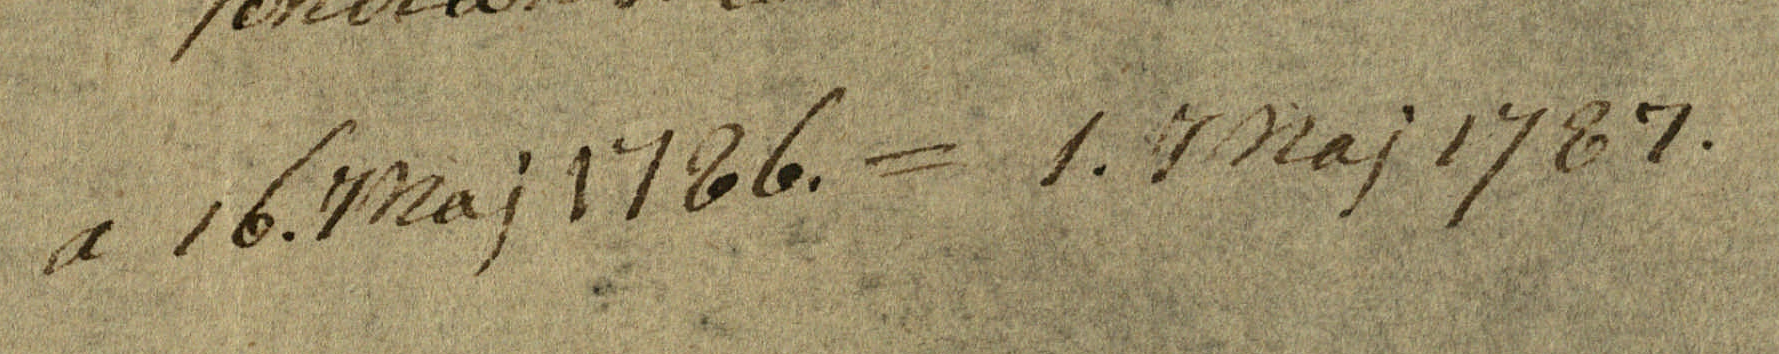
a 16. Maj 1786. -1. Maj 1787.
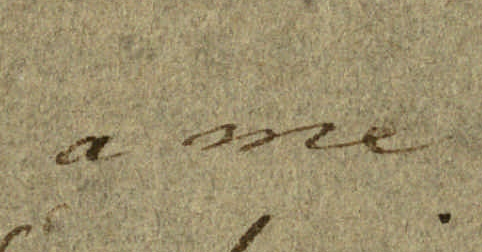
a me
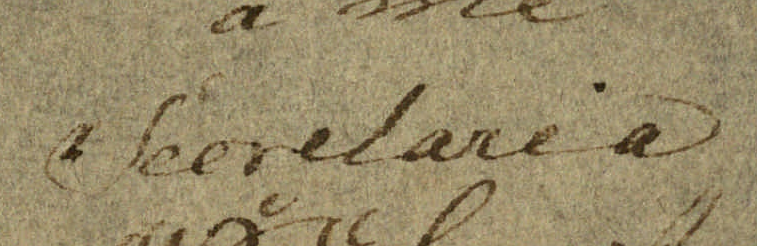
Secretaria
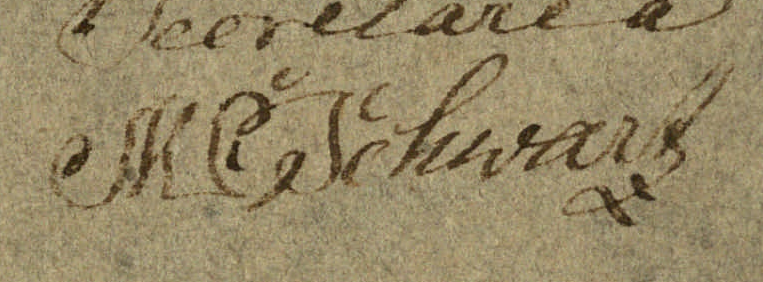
M. C Schwartz
